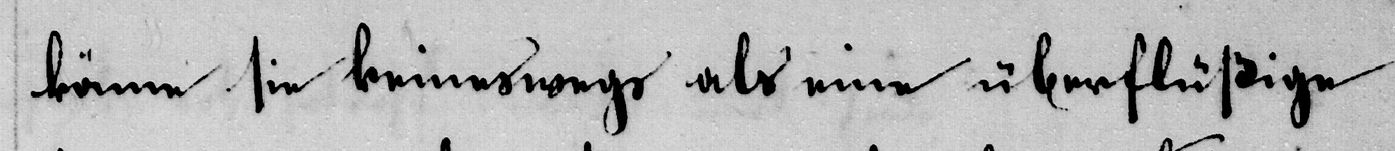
könne sie keineswegs als eine überflüßige
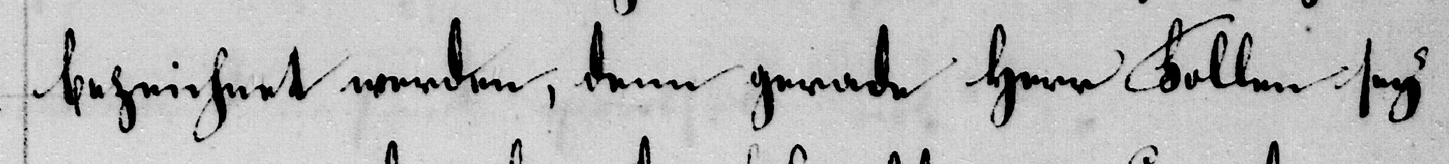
bezeichnet werden, denn gerade Herr Follen sey
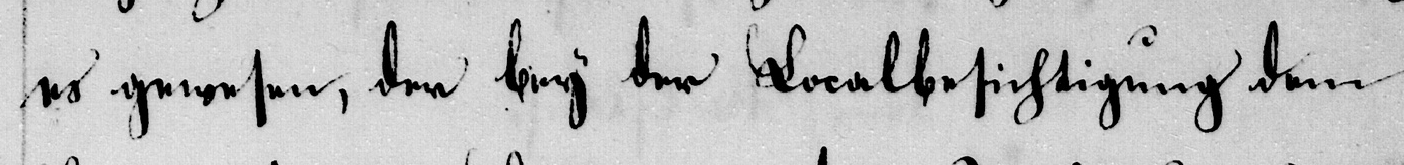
es gewesen, der bey der Localbesichtigung dem
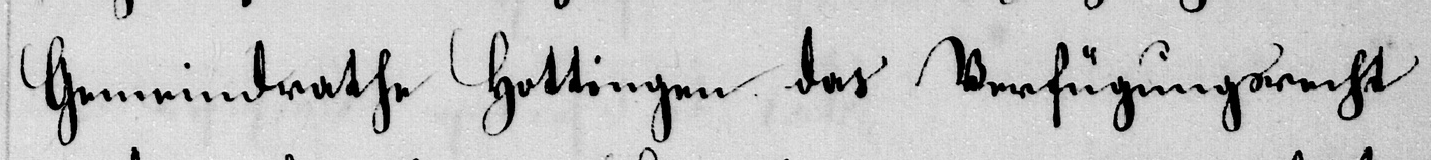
Gemeindrathe Hottingen das Verfügungsrecht
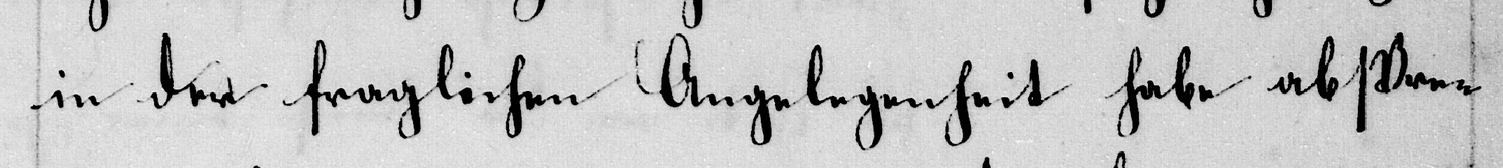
in der fraglichen Angelegenheit habe abspre¬
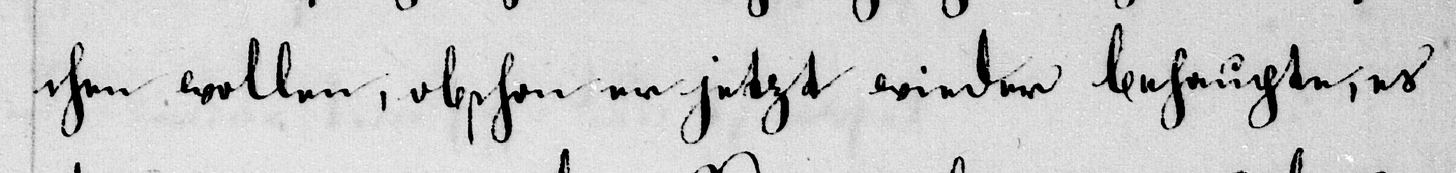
chen wollen, obschon er jetzt wieder behaupte, es
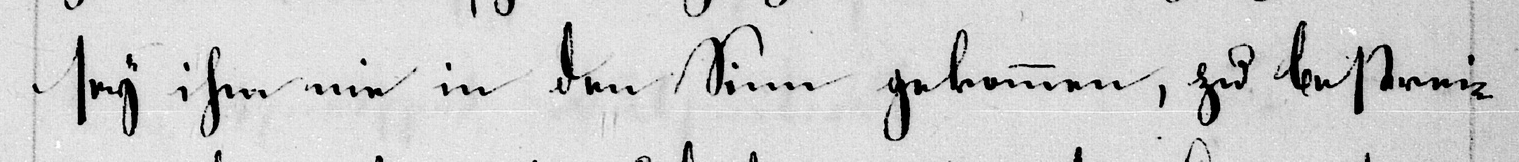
sey ihm nie in den Sinn gekommen, zu bestrei¬
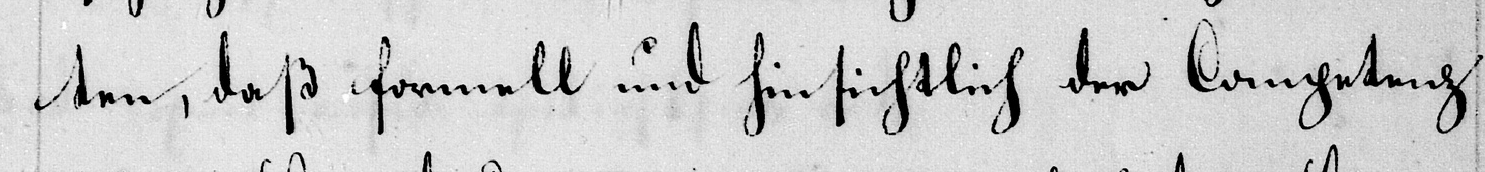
ten, daß formell und hinsichtlich der Competenz
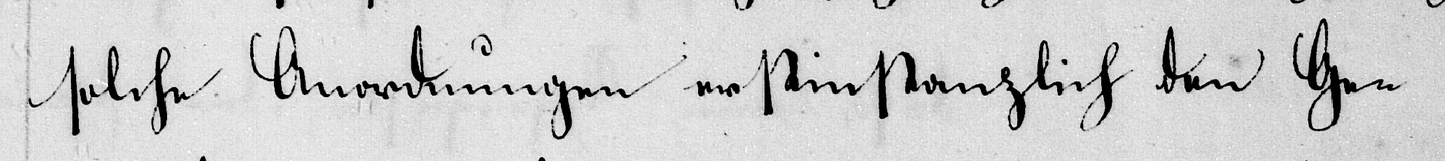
solche Anordnungen erstinstanzlich den Ge¬
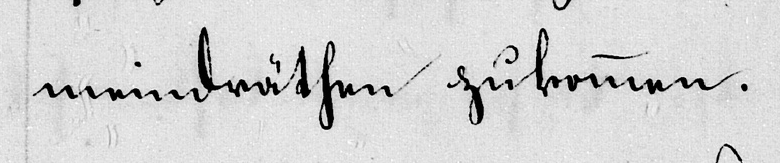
meindräthen zukommen.
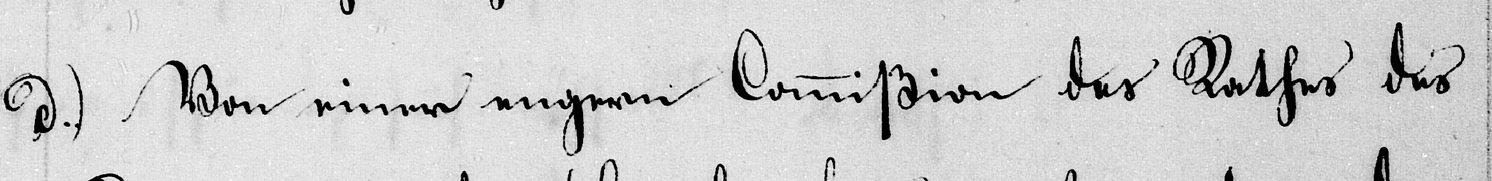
d.) Von einer engern Commißion des Rathes des
